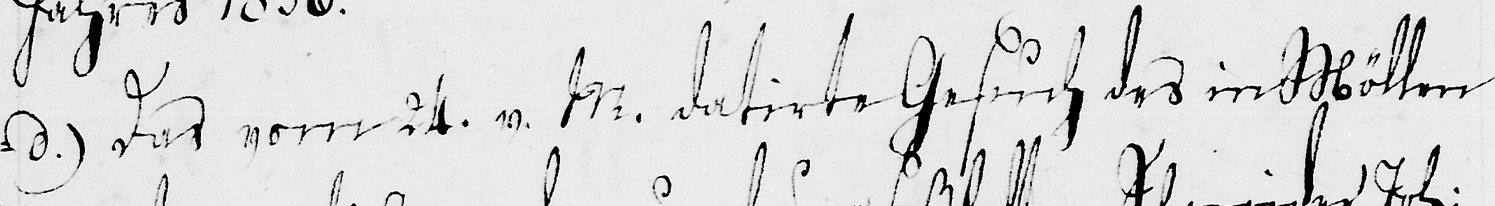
d.) Das vom 24 v. M. datirte Gesuch des in Möllen
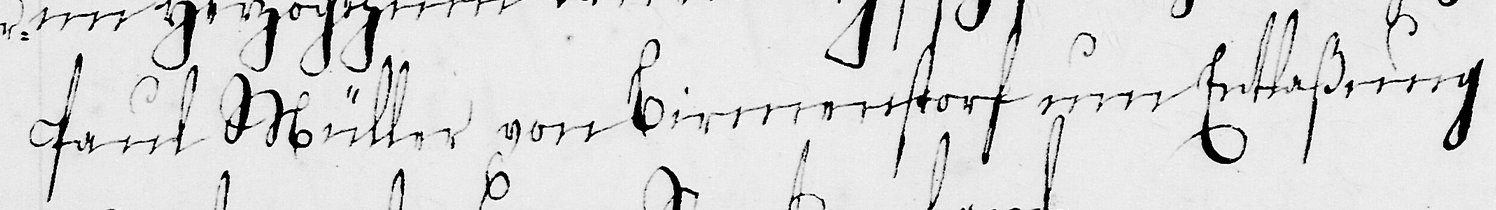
Paul Müller von Birmenstorf um Entlaßung
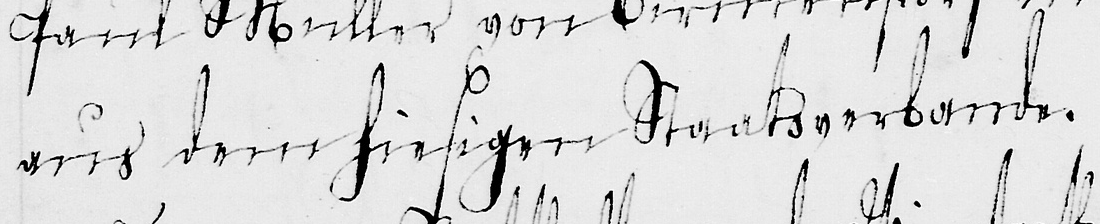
aus dem hiesigen Staatsverbande.
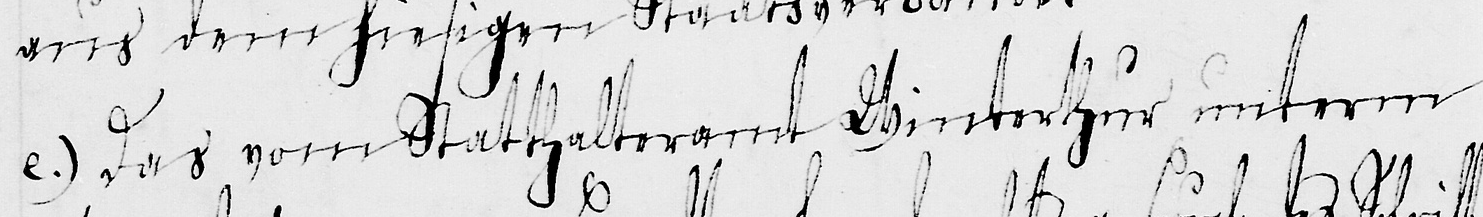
e.) Das vom Statthalteramt Winterthur unterm
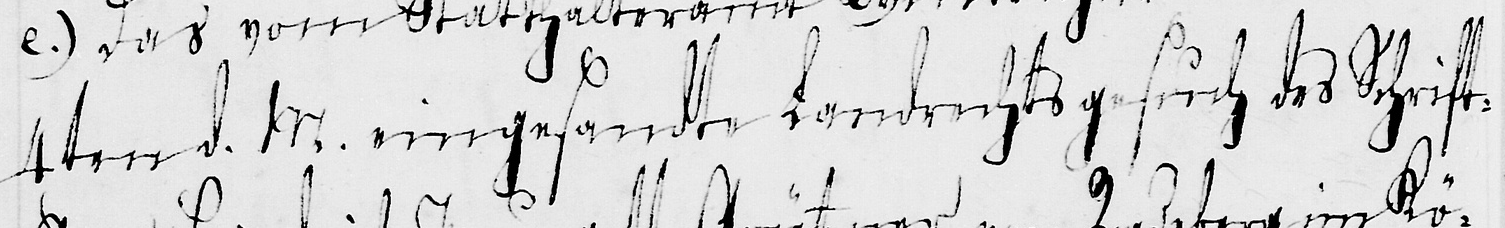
4ten d. M. eingesandte Landrechtsgesuch des Schrift¬
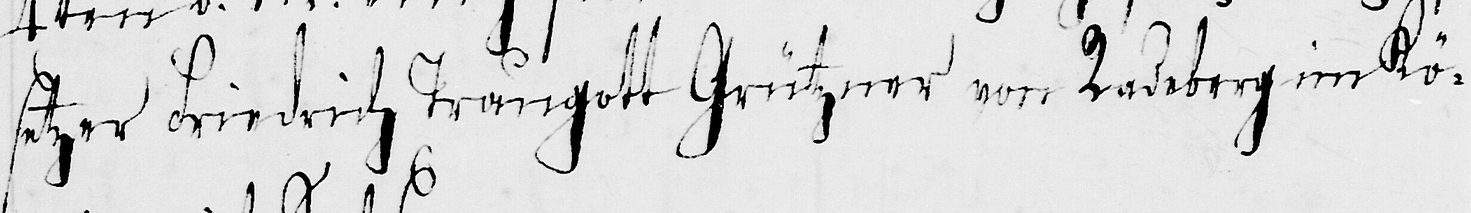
setzer Friedrich Traugott Grützner von Radeberg im Kö¬
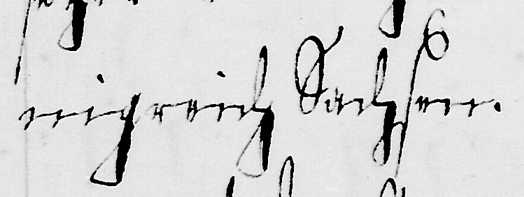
nigreich Sachsen.
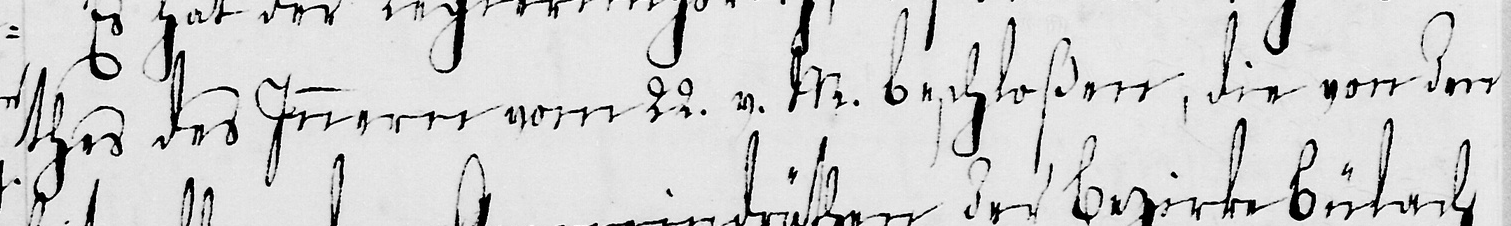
thes des Innern vom 22 v. M. beschloßen, die von den
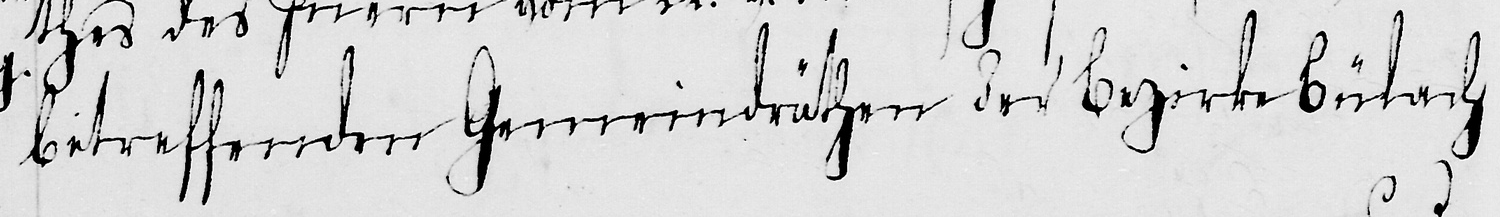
betreffenden Gemeindräthen der Bezirke Bülach
